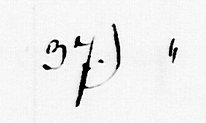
37.)
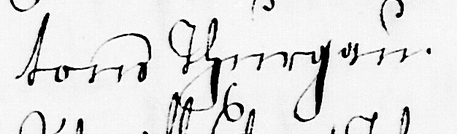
tons Thurgau.
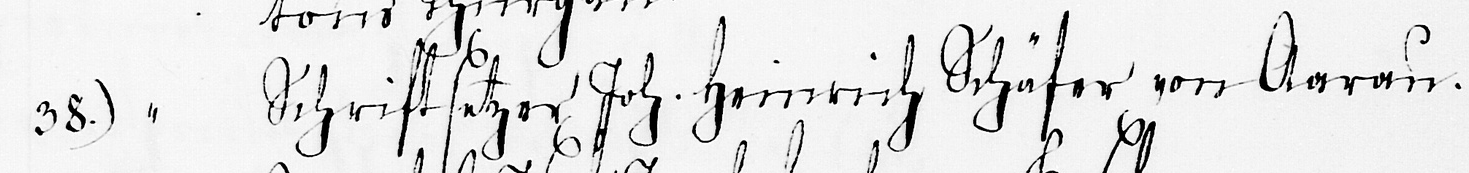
38.) “ Schriftsetzer Joh. Heinrich Schäfer von Aarau.
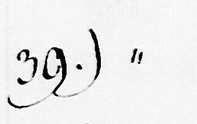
39.)
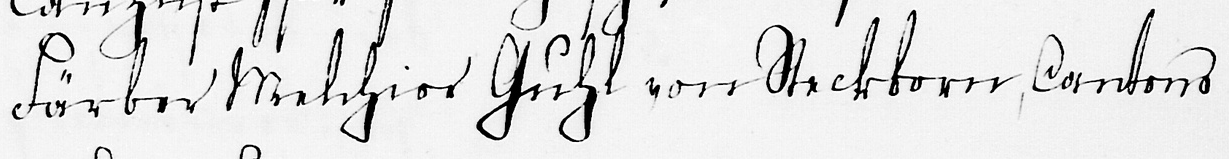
ärber Melchior Guhl von Steckborn, Cantons
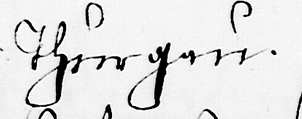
Thurgau.
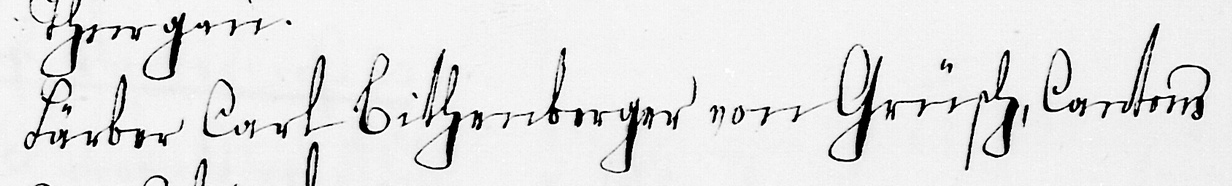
ärber Carl Bithenberger von Grüsch, Cantons
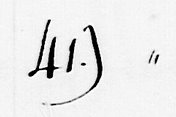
41.)
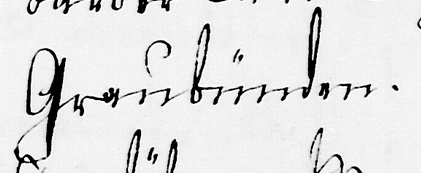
Graubünden.
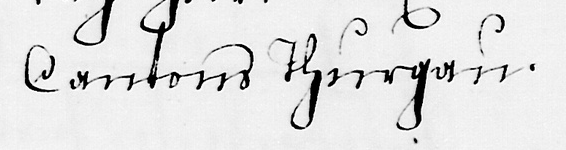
Cantons Thurgau.
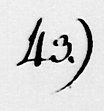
42.)
